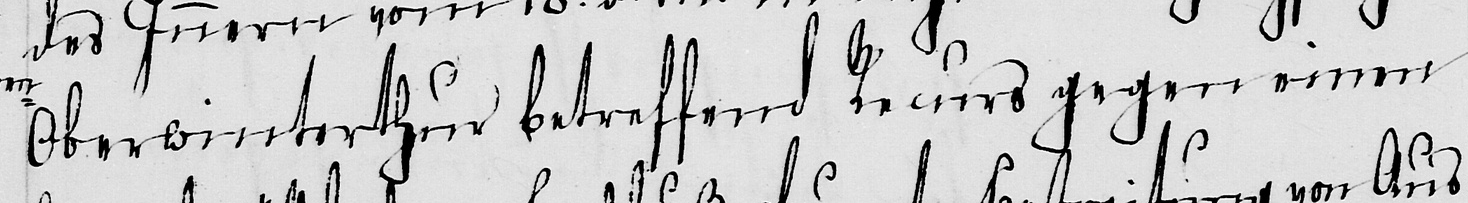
Oberwinterthur betreffend Recurs gegen einen
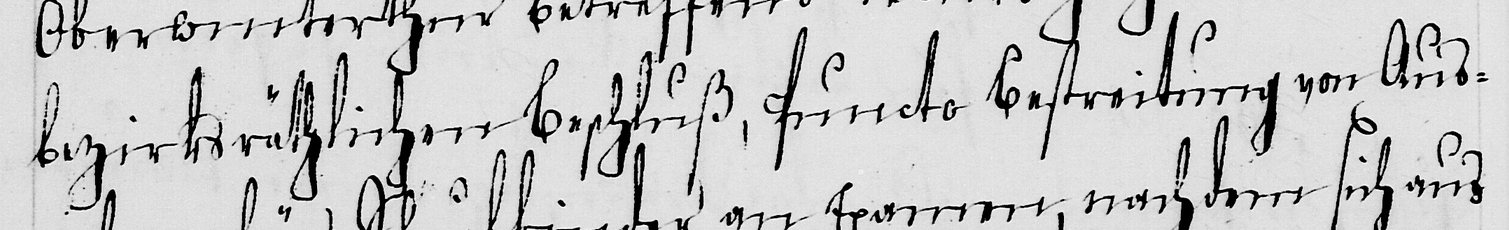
bezirksräthlichen Beschluß, Puncto Bestreitung von Aus¬
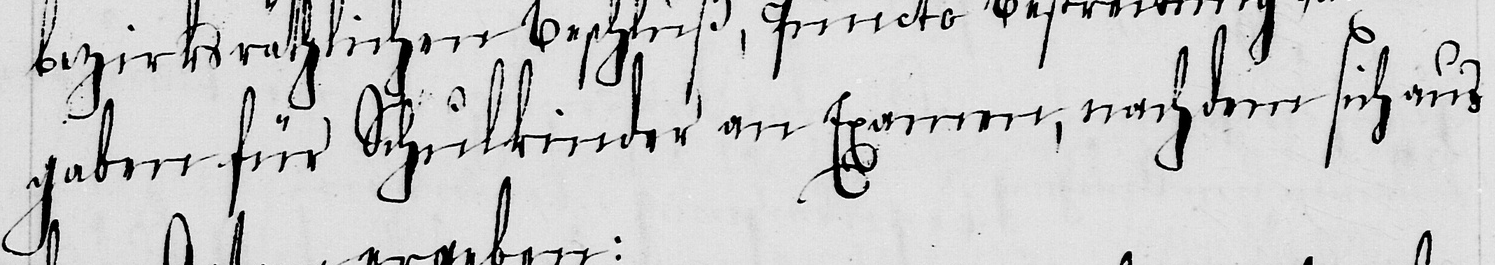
gaben für Schulkinder an Examen, nachdem sich aus
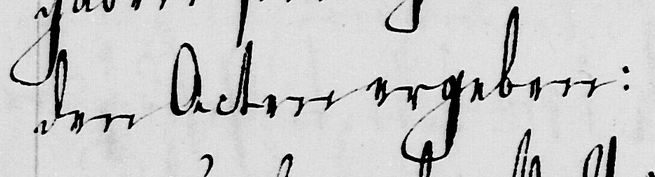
den Acten ergeben:
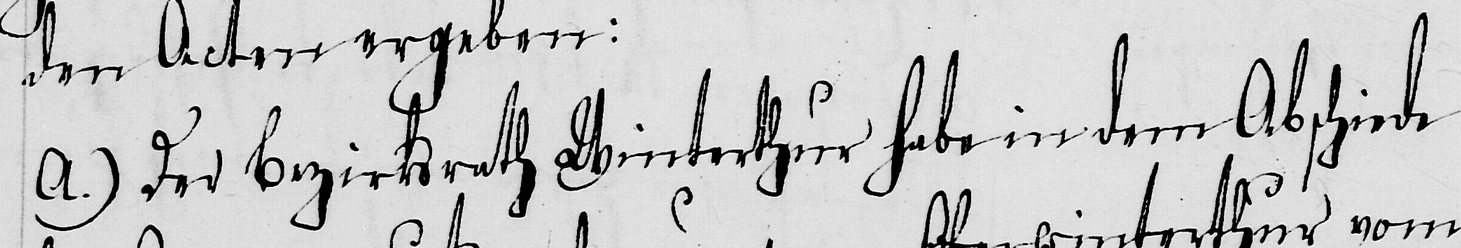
A.) Der Bezirksrath Winterthur habe in dem Abschiede
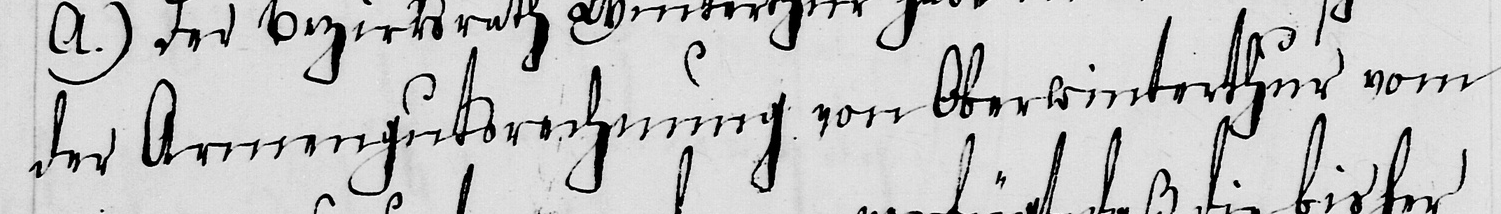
der Armengutsrechnung von Oberwinterthur vom
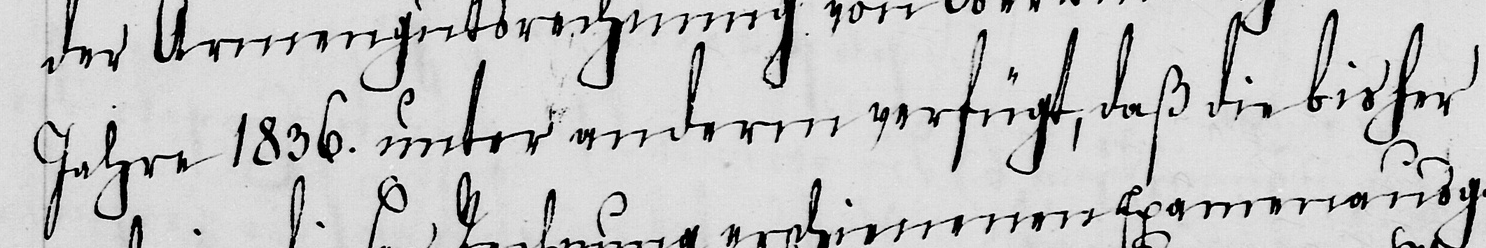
Jahre 1836. unter anderem verfügt, daß die bisher
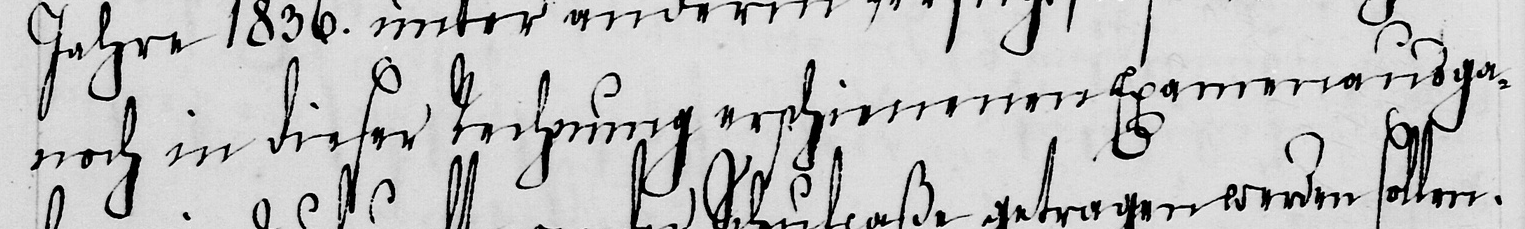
noch in dieser Rechnung erschienenen Examenausga¬
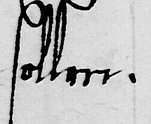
sollen.
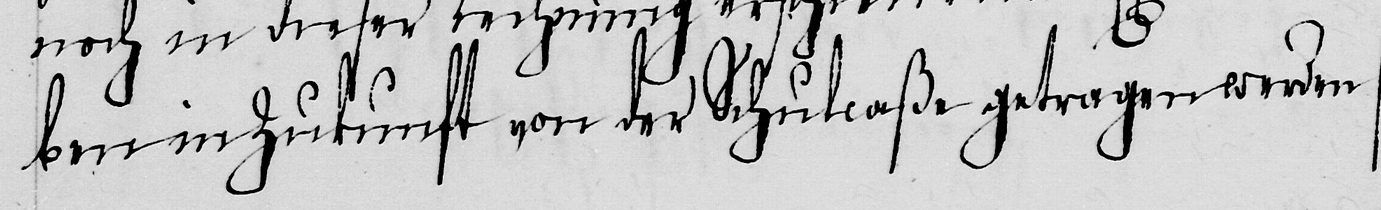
ben in Zukunft von der Schulcaße getragen werden
